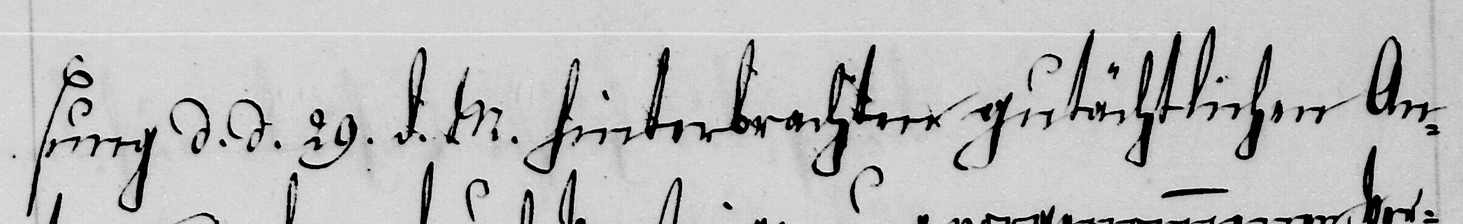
sung d. d. 29. d. M. hinterbrachten gutächtlichen An¬
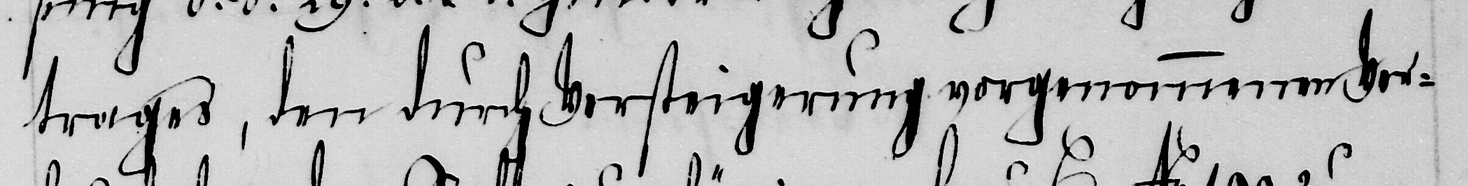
trages, den durch Versteigerung vorgenommenen Ver¬
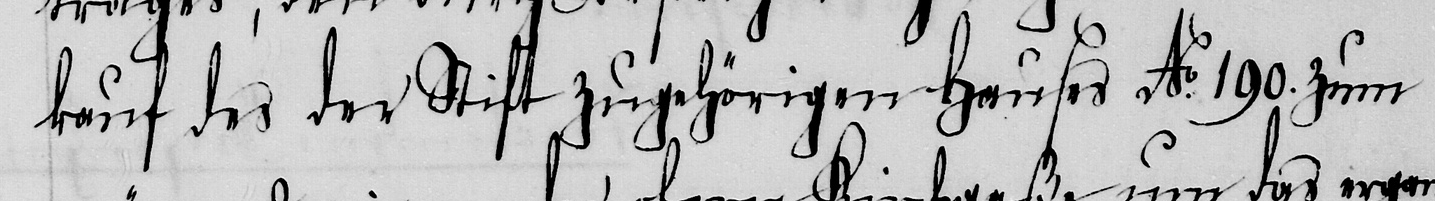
kauf des der Stift zugehörigen Hauses No. 190. zum
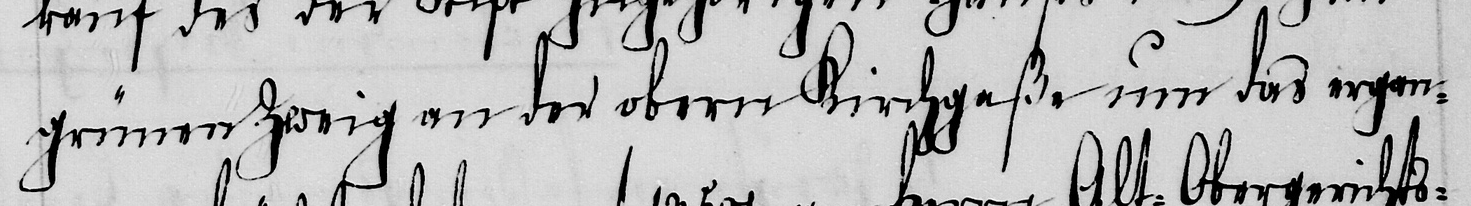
grünen Zweig an der obern Kirchgaße um das ergan¬
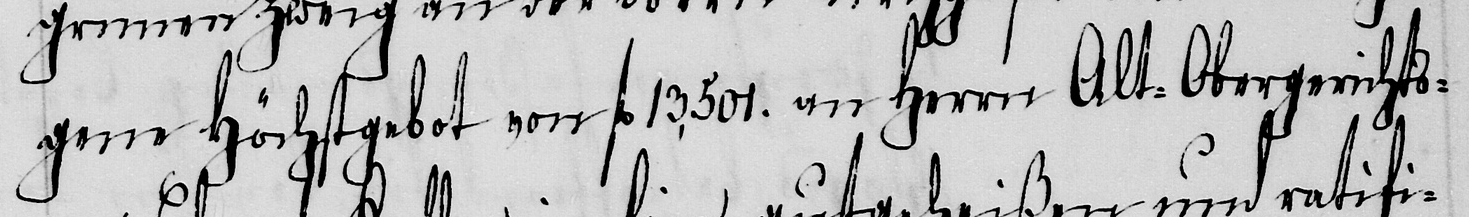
gene Höchstgebot von fl. 13'501. an Herrn Alt-Obergerichts¬
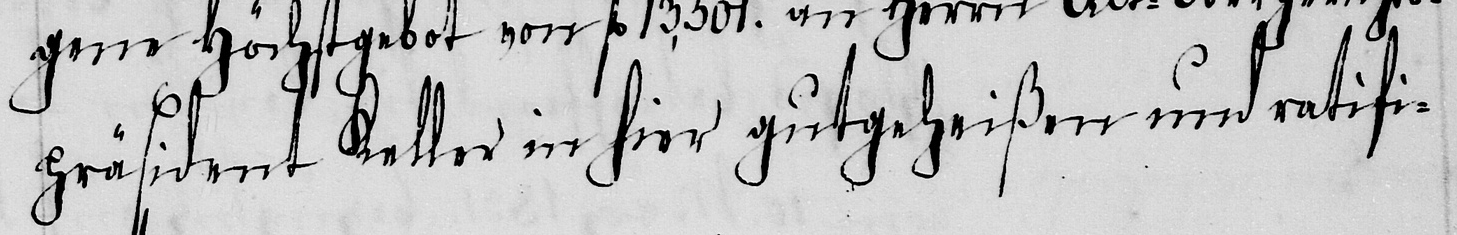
präsident Keller in hier gutgeheißen und ratifi¬
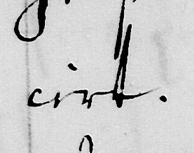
cirt.
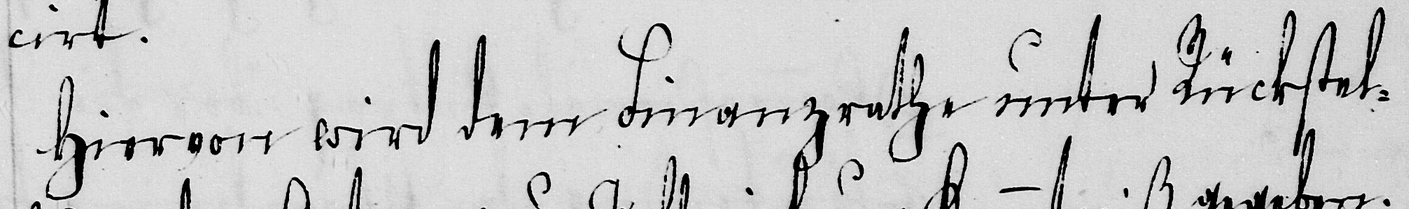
Hiervon wird dem Finanzrathe unter Rückstel¬
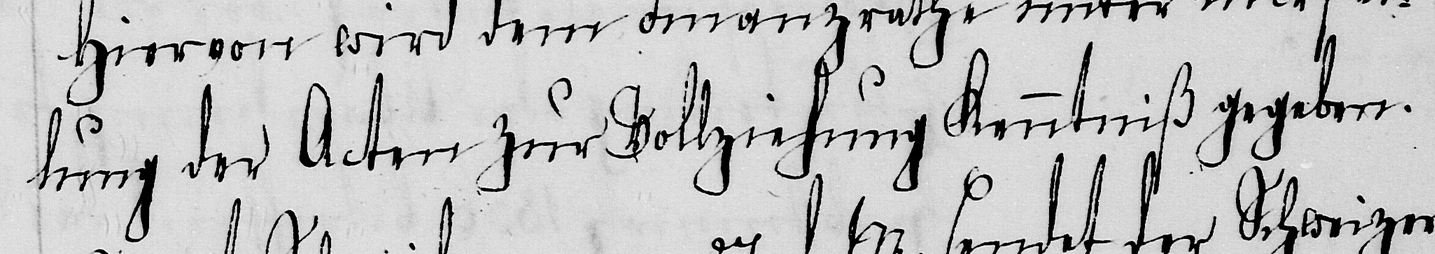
lung der Acten zur Vollziehung Kenntniß gegeben.
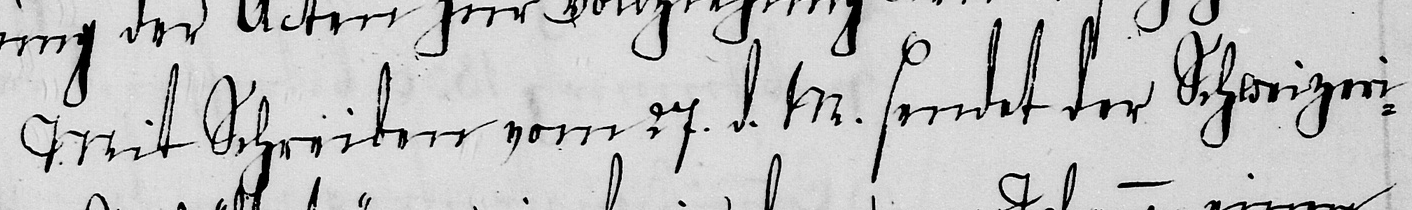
Mit Schreiben vom 27. d. M. sendet der Schweizeri¬
